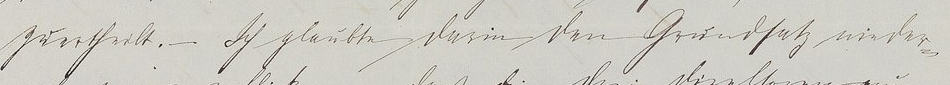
zuertheilt. – Ich glaube darin den Grundsatz nieder-
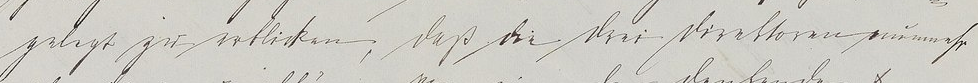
gelegt zu erblicken, daß die drei Direktoren nunmehr
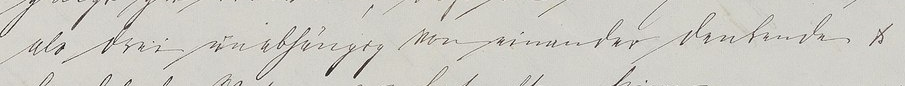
als drei unabhängig von einander denkende &
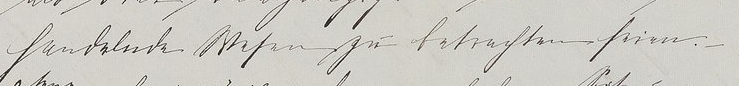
handelnde Wesen zu betrachten seien. –
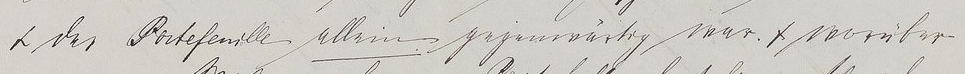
& des Portefeuille allein gegenwärtig war & worüber
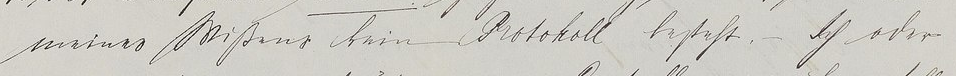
meines Wißens kein Protokoll besteht. – Ich oder
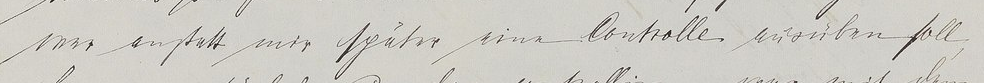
wer anstatt mir später eine Controlle ausüben soll,
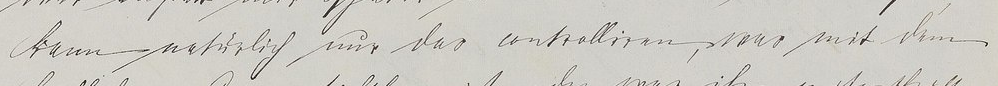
kann natürlich nur das controlliren, was mit dem
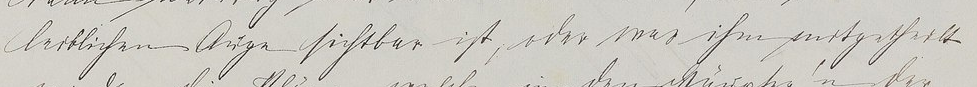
leiblichen Auge sichtbar ist, oder was ihm mitgetheilt
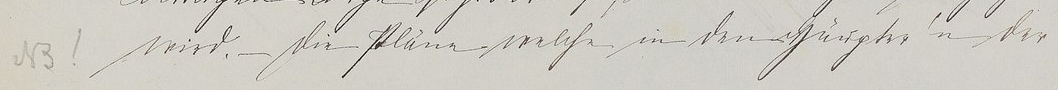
wird. – Die Pläne welche in den Häupter'n der
